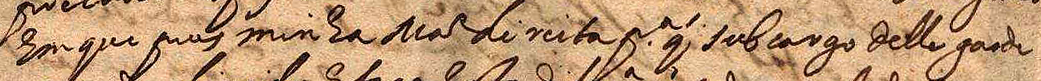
Em que pus minha Maõ direita p.a q̄ sub cargo delle garde
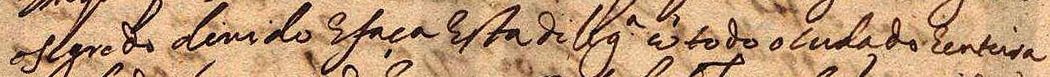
o segredo diuido E faça Esta dilig.a cō todo o cudado E enteira
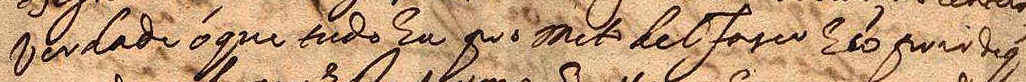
Verdade o que tudo Eu prometo de o faser E cōprir de q̄
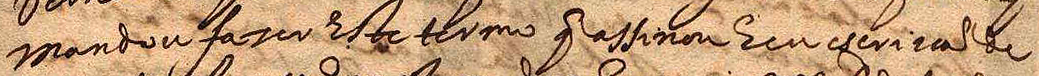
mandou fazer Este termo q̄ assinou E eu escriuaõ de
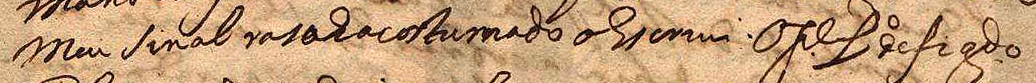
meu sinal raso E acostumado o Escreui. O p.e Po de figdo
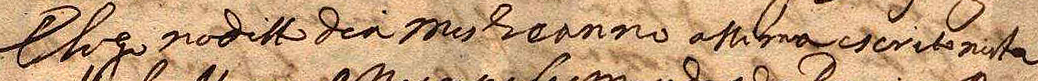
E logo no ditto dia mes E anno assima escrito nesta
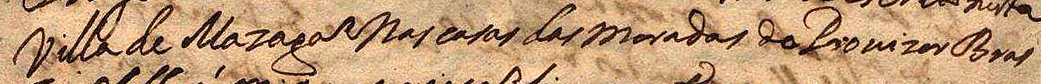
Villa de Mazagāo nas casas das moradas do Prouizor Bras
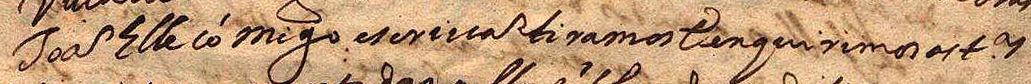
Joaõ Elle comigo escriuāo tiramos E enquirimos as t.as
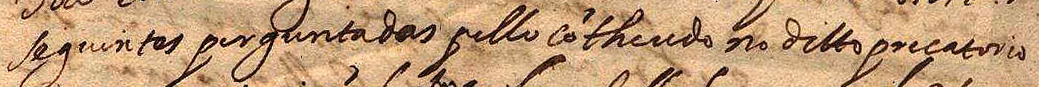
seguintes perguntadas pello cōtheudo no ditto precatorio
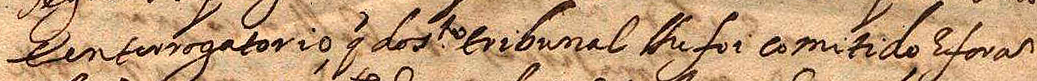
e enterrogatorio, q̄ do s.to tribunal lhe foi comitido, E foraõ
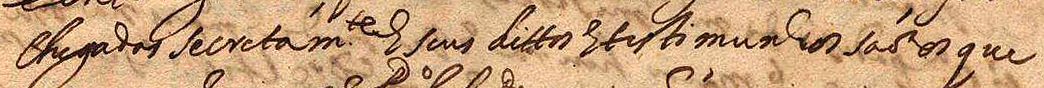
chegadas secretam.te E seus dittos E testimunhos saõ os que
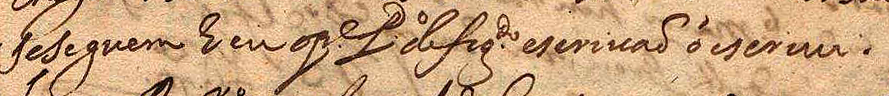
se seguem E eu o pe Po de fig.do escriuaõ o escreui.
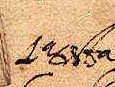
1a testa
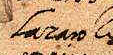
Lazaro Ro
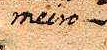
meiro -
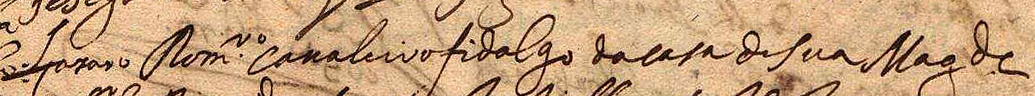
Lazaro Rom.ro caualeiro fidalgo da casa de sua Magd.e
